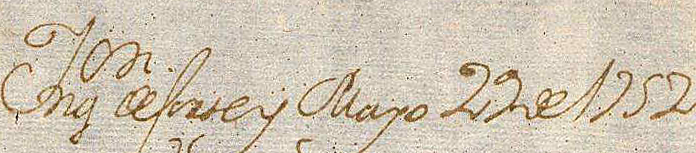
Inqon de Corte y Mayo 29 de 1752
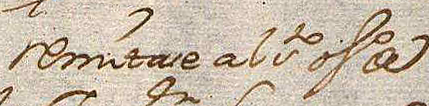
remitase al sto of.o de
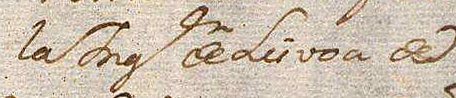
la Inqon de Lisvoa de
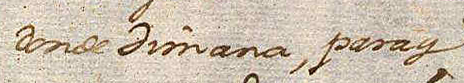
donde dimana, para q̄
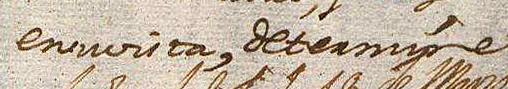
en su vista, determine
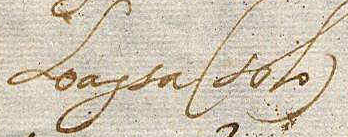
Loaysa (solo)
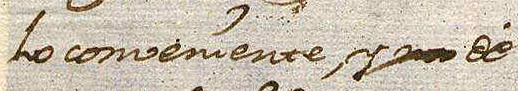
lo conveniente, y _ de
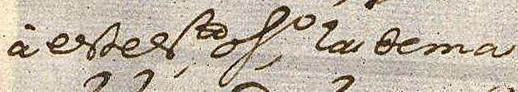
à este S.to of.o las demas
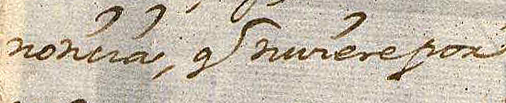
noticias, q̄ tuviere por
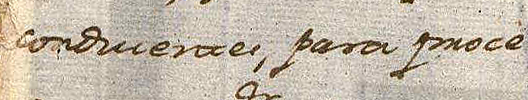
conducentes, para proce
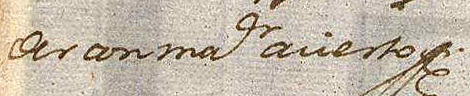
der con maor acierto
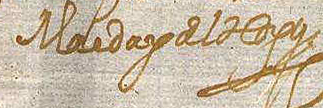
Maeda y del Hoyo
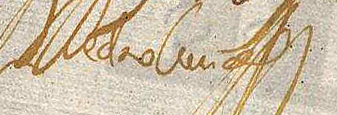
Pedro Curiel
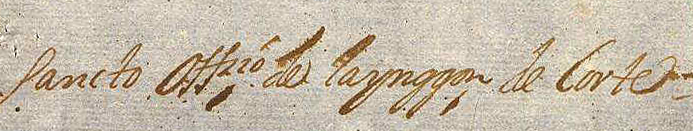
Sancto Off.sso de la ynqqon de Corte
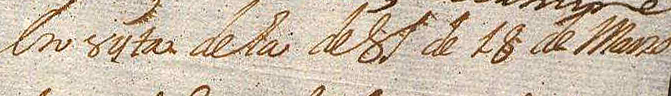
En vista de las de V S de 18 de Marzo
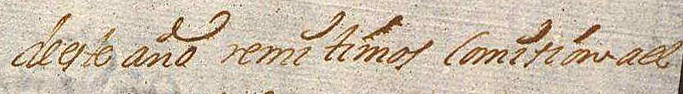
de este año remitimos comition all
